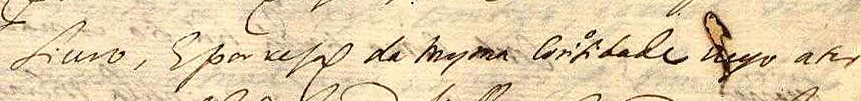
Liuro, E por resaõ da mesma corisidade ueyo a ter
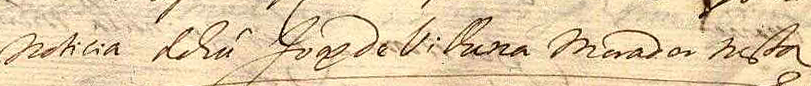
noticia de hū Joaõ de Villena morador nesta
